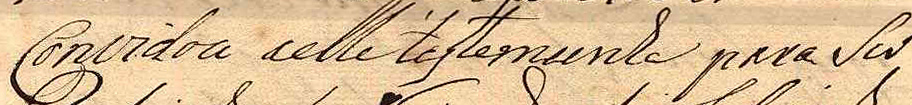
Convidou a elle testemunha para ser
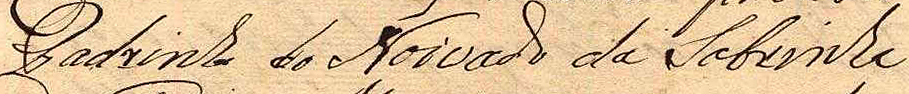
Padrinho do Noivado da Sobrinha
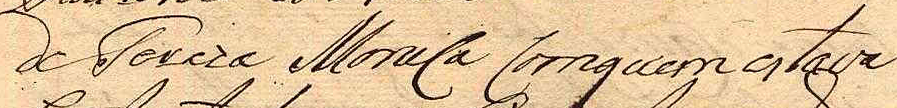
de Tereza MoniCa, Com quem estava
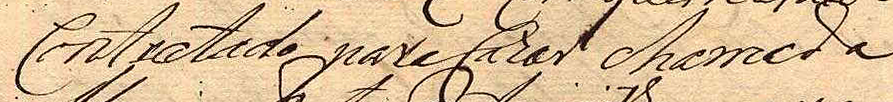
Contratado para Cazar chamada
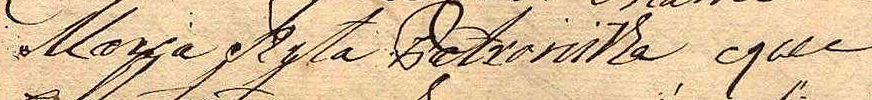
Maria Rita Petronilha e que
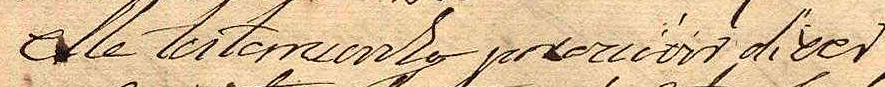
elle testemunha por ouvir dizer
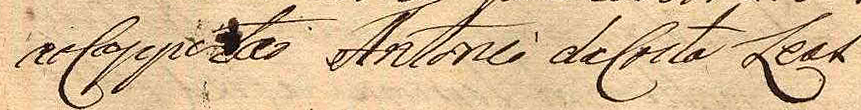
ao Cappitao Antonio da Costa Leal
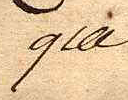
que
